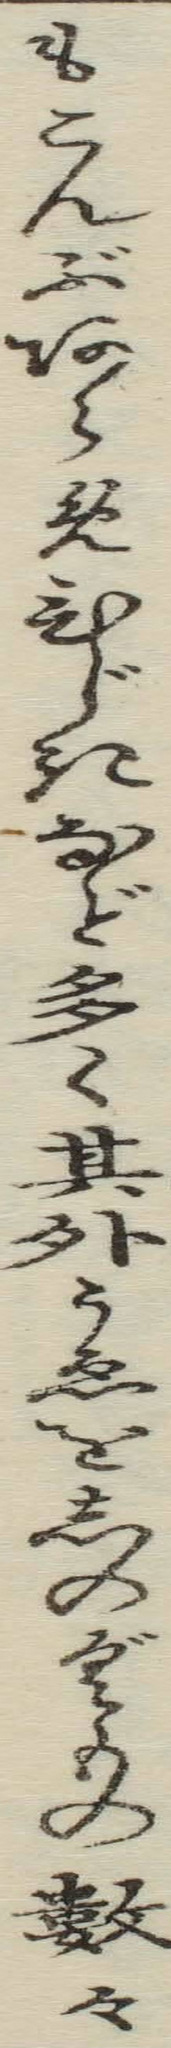もこんぶあらめひじきなど多く其外うゑをしのぐもの数々
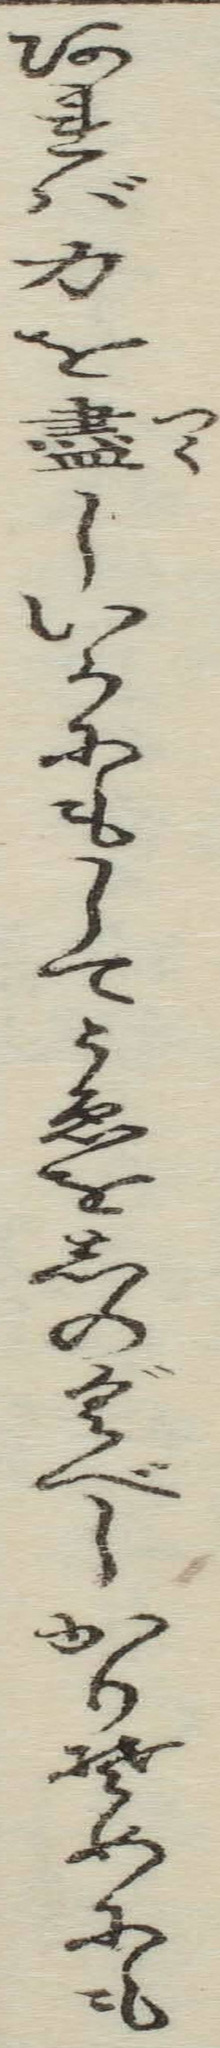あれば力を尽しいかにもしてうゑをしのぐべしかりそめにも
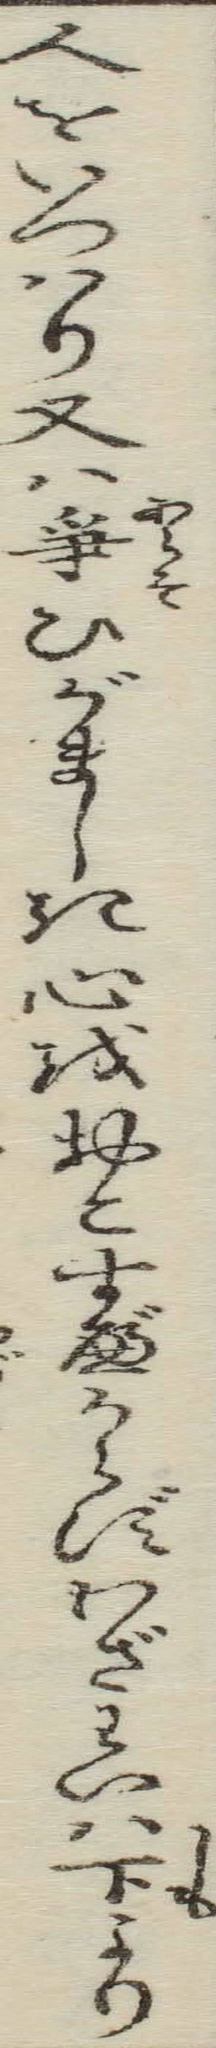人をいつはり又は争ひがましき心をおこすべからずわざわいは下より
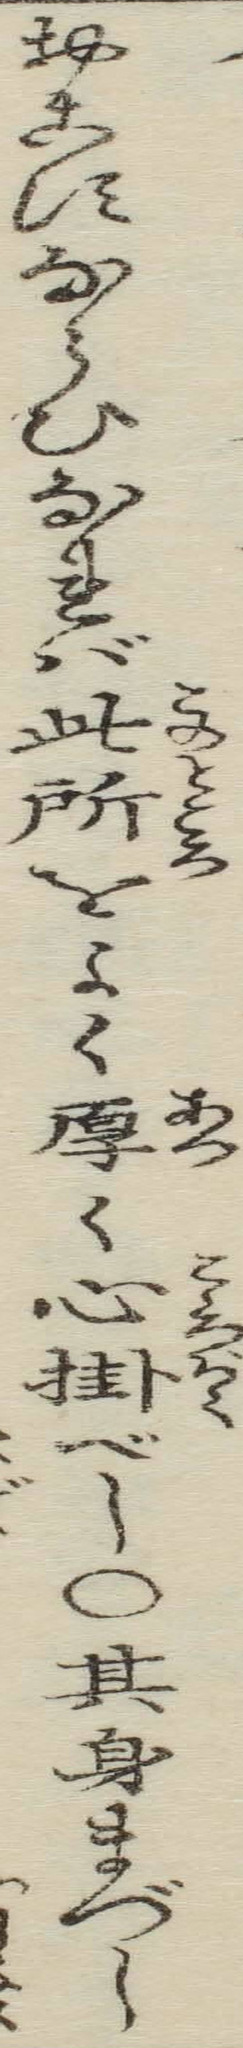おこすならひなれば此所をよく厚く心掛べし○其身まづし
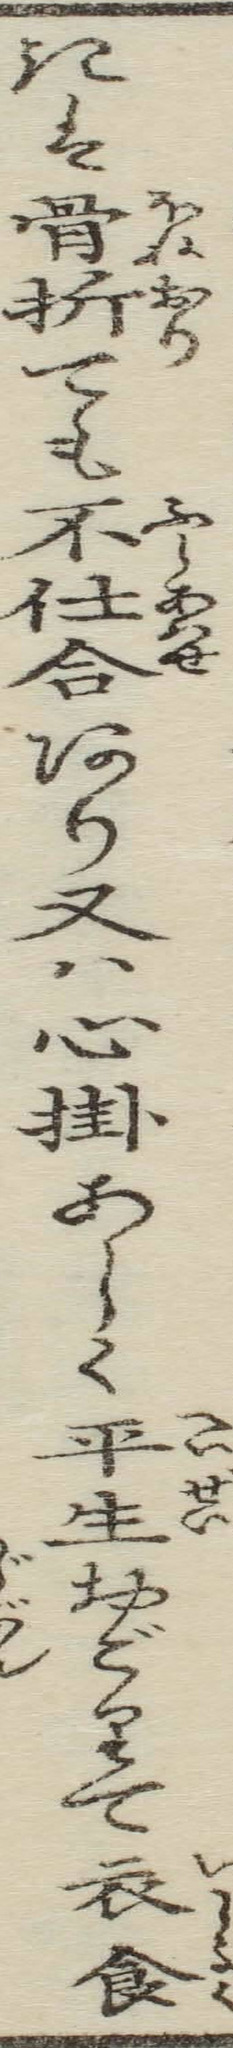きは骨折ても不仕合あり又は心掛あしく平生おごりて衣食
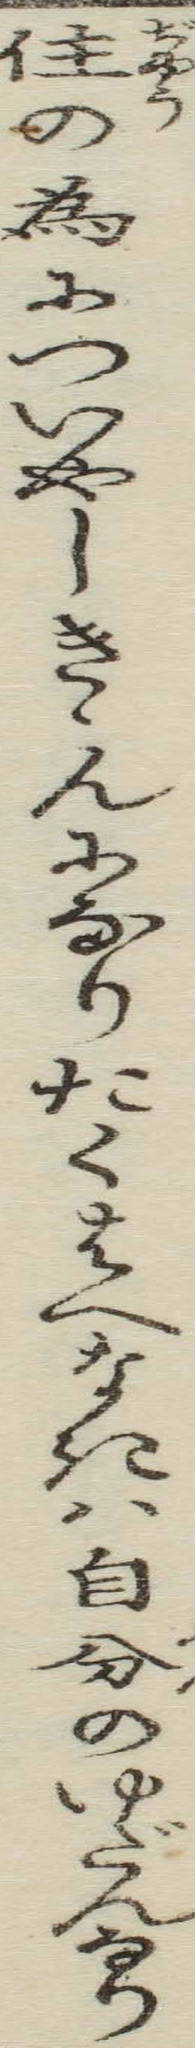住の為についやしきゝんになりたくはへなきは自分のゆだんなり
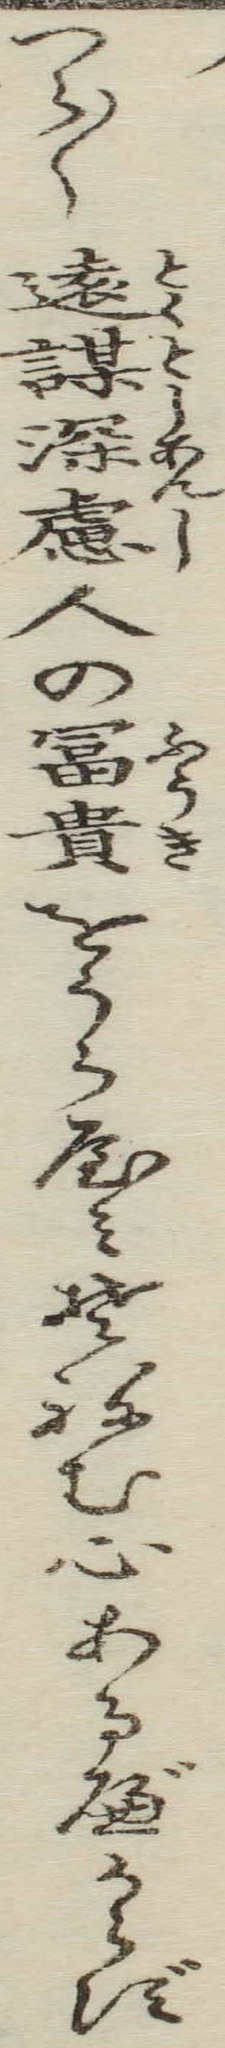つら〳〵遠謀深慮人の富貴をうらやみそねむ心あるべからず
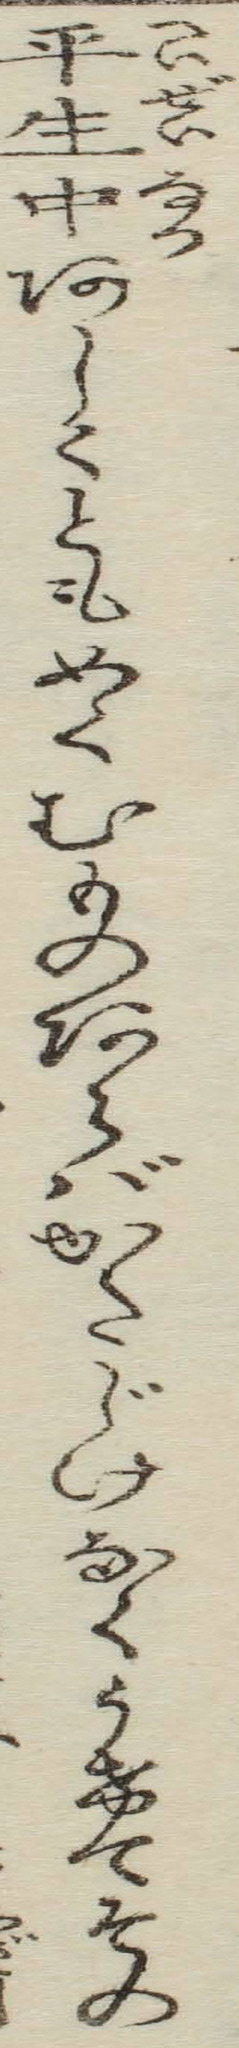平生中あしくともめくむものあらばかたじけなくうけてその
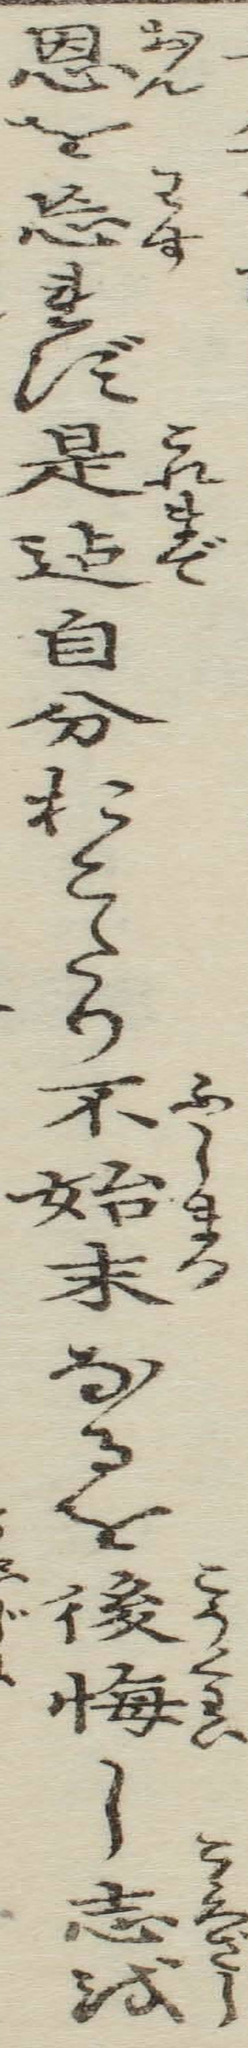恩を忘れず是迄自分おこたり不始末なるを後悔し志を
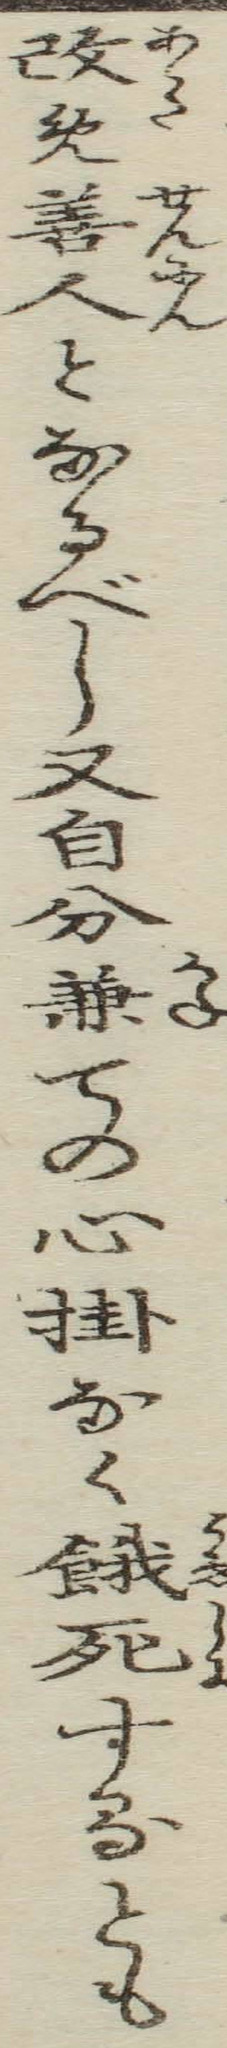改め善人となるべし又自分兼ての心掛なく餓死するとも

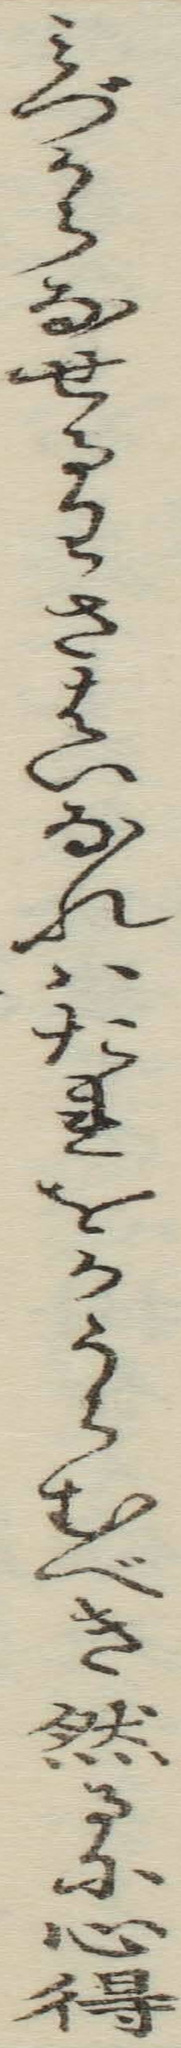みづからなせるわさはいなれはたれをかうらむべき然るに心得
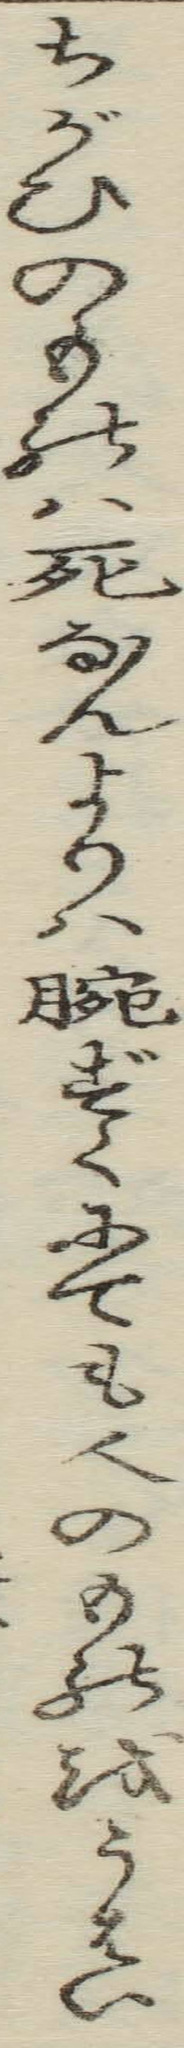ちがひのものは死なんよりは腕ずくにても人のものをうはい
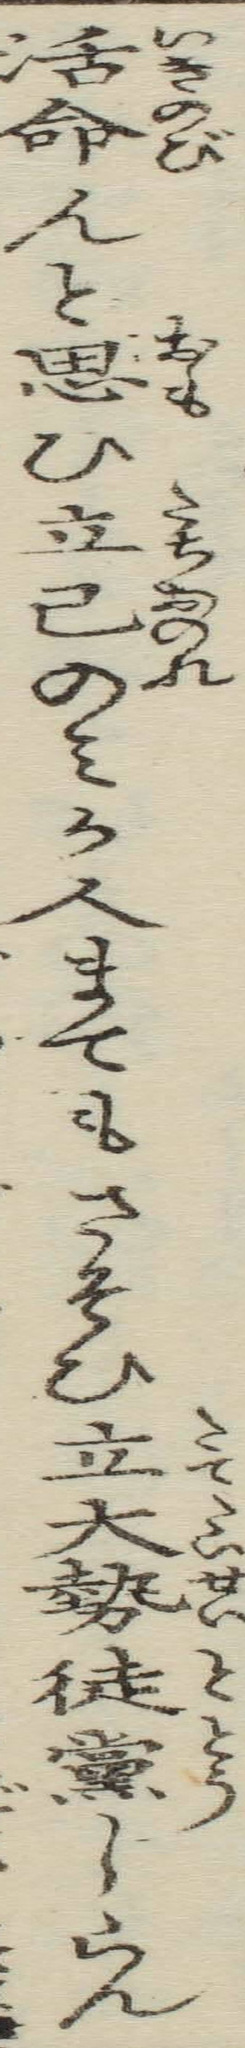活命んと思ひ立己のみか人まてもさそひ立大勢徒党しらん
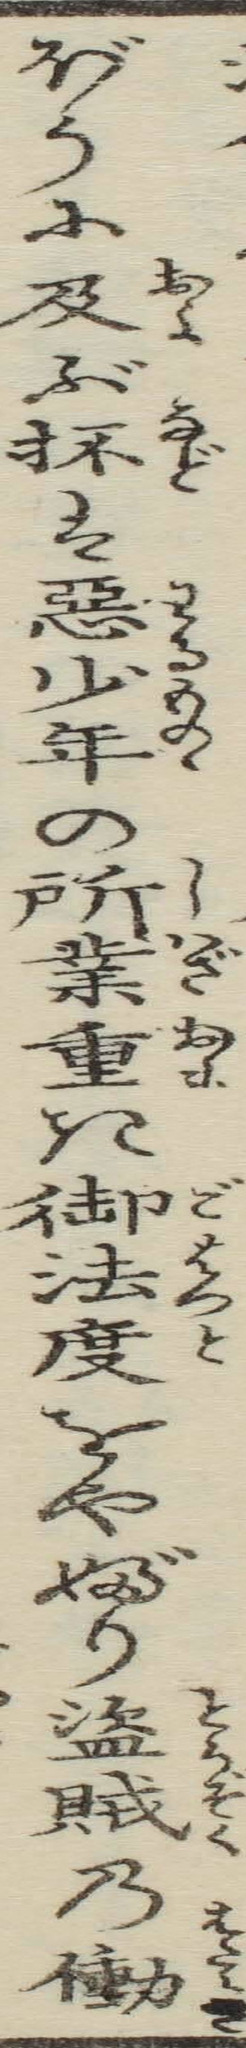ぼうに及ぶ抔は悪少年の所業重き御法度をやぶり盗賊の働
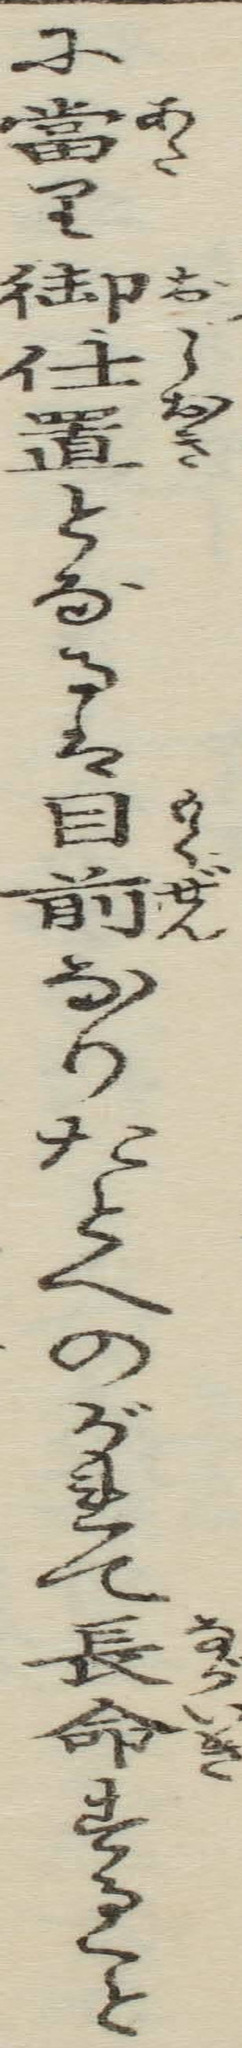に当り御仕置となるは目前なりたとへのがれて長命すること
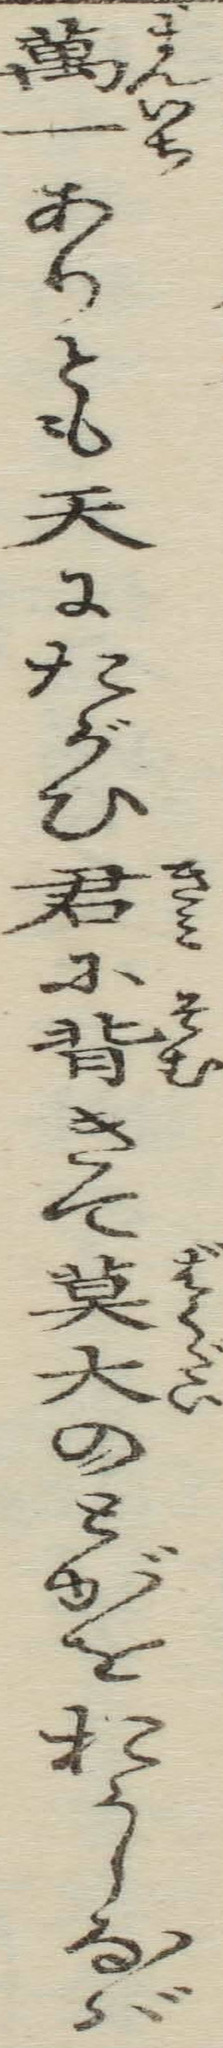万一ありとも天にたがひ君に背きて莫大のとがをおかしなば
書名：救荒便覧
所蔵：国文学研究資料館
